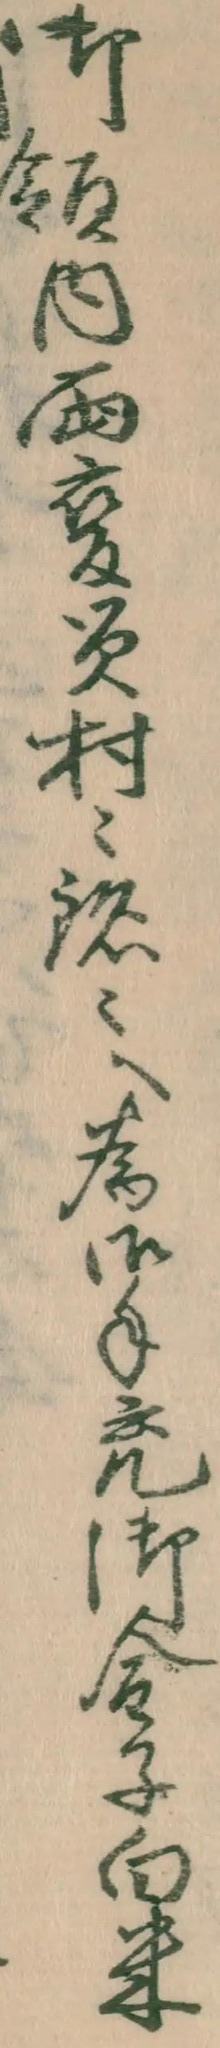御領内両変災村々銘々へ為御手充御金子白米
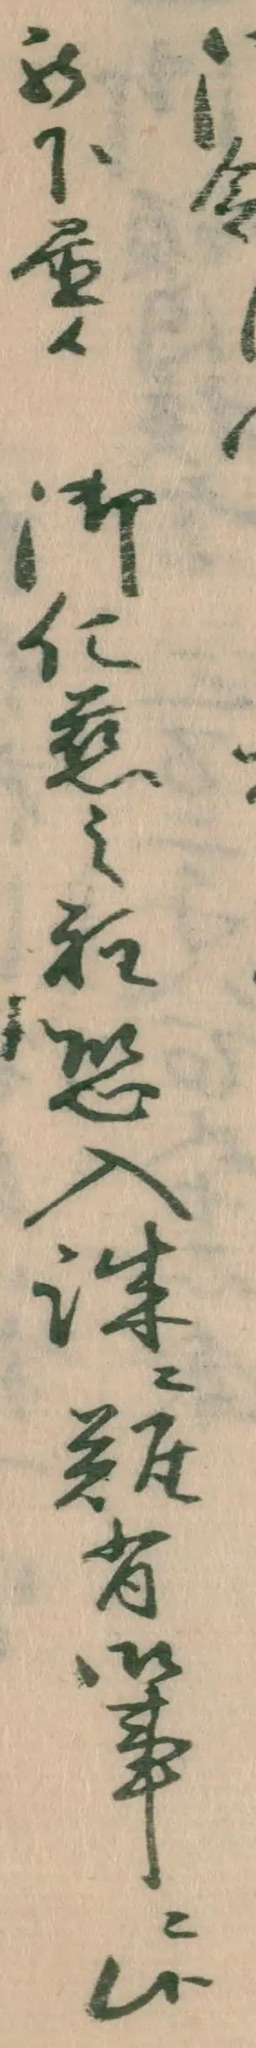被下置候御仁恵之程恐入誠二難有御事二候
